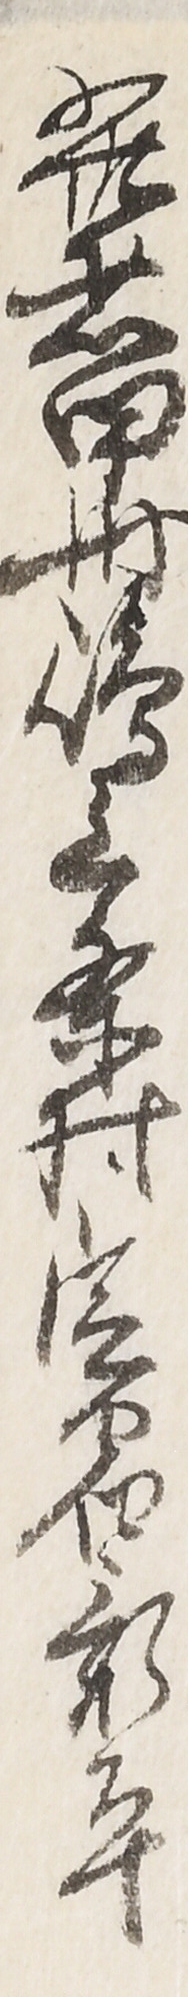此者甲州島上条村定宿新平
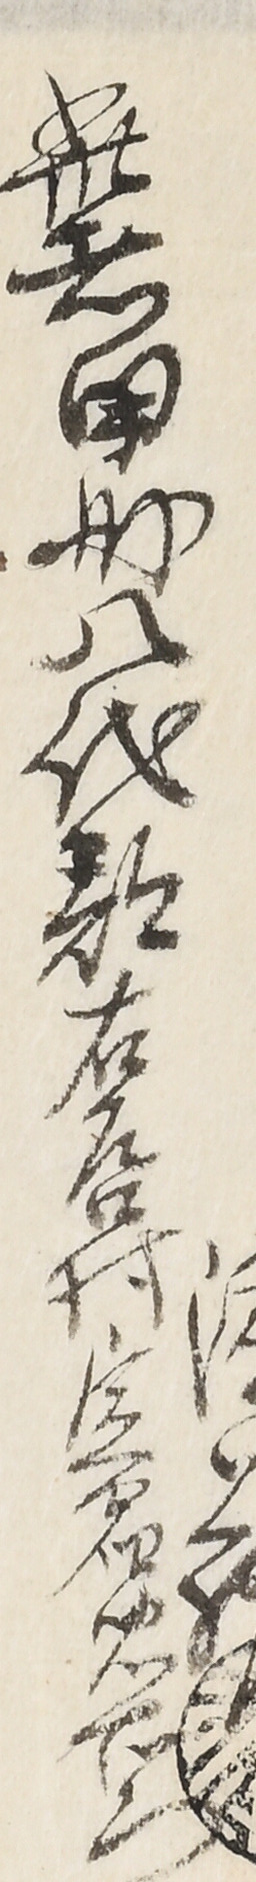此者甲州八代郡右左口村定宿忠右衛門
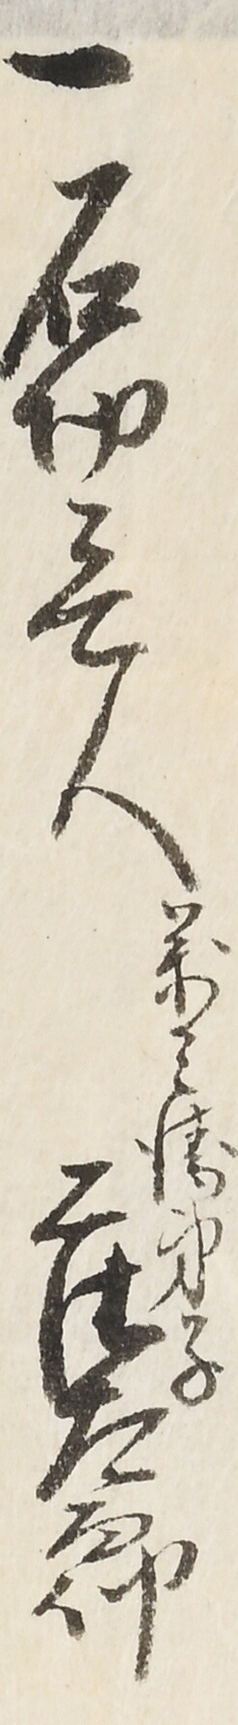一石切壱人富十
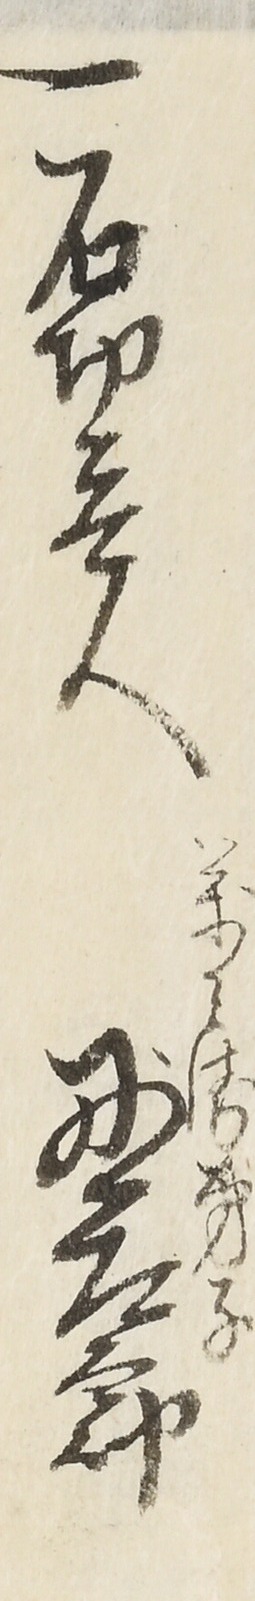一石切壱人善五郎
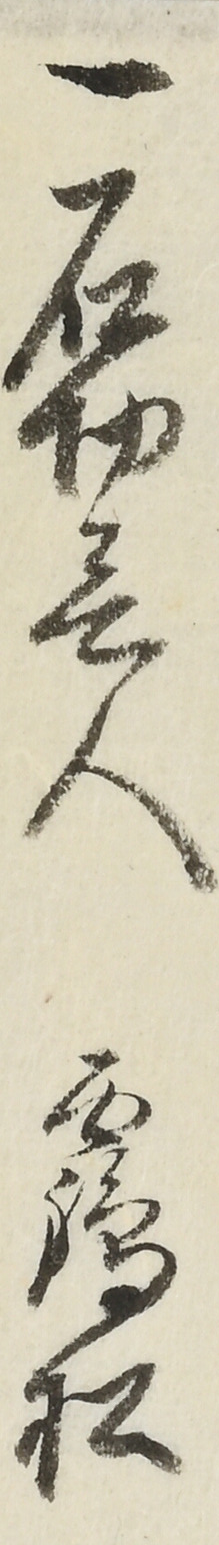一石切壱人富十
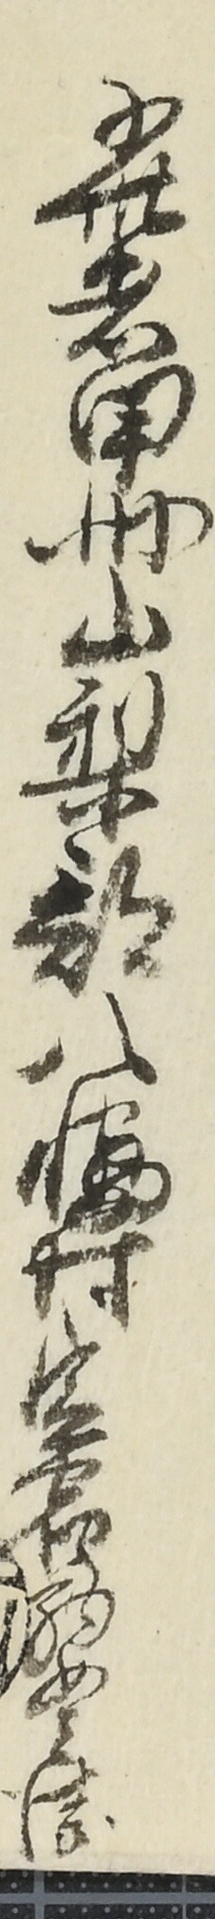此者甲州山梨郡八幡村定宿要兵衛

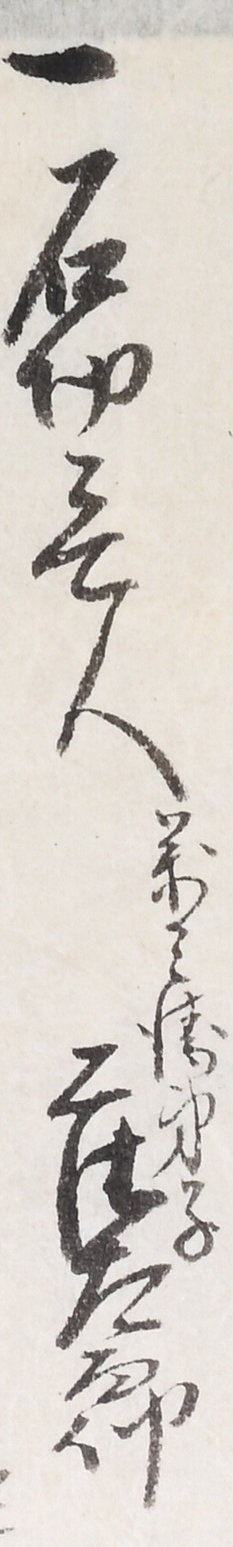一石切壱人鶴松
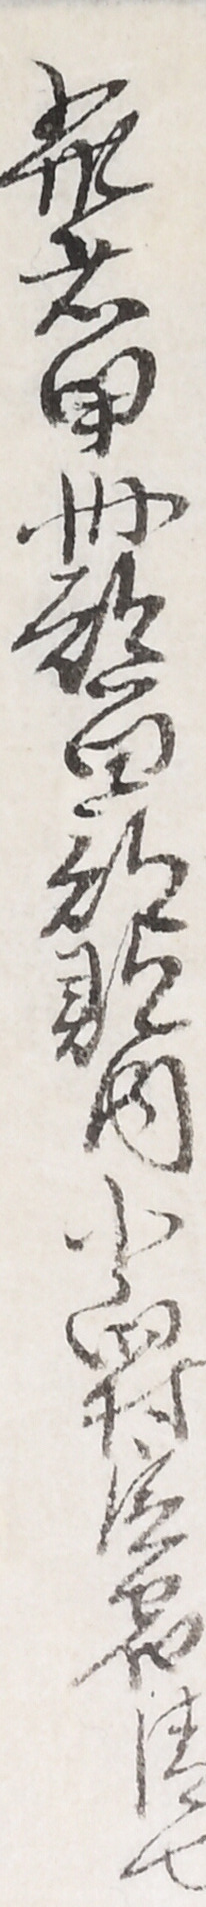此者甲州都留郡郡内小向村定宿清七
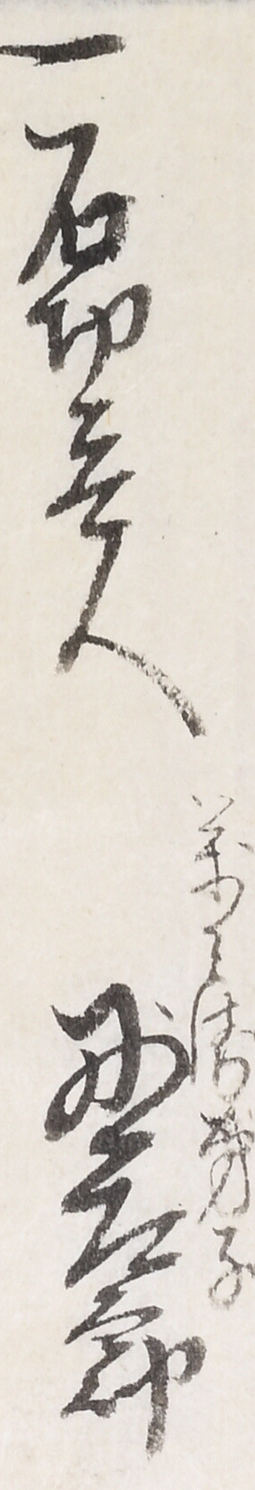一石切壱人庄五郎
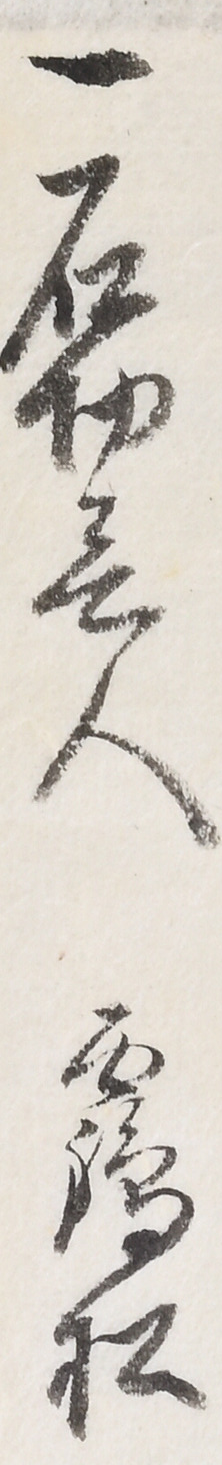一石切壱人鶴松
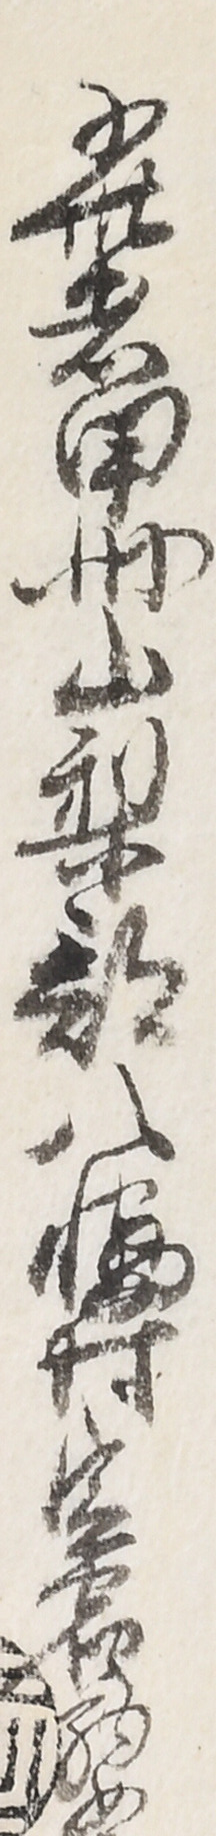此者甲州山梨郡八幡村定宿要兵衛
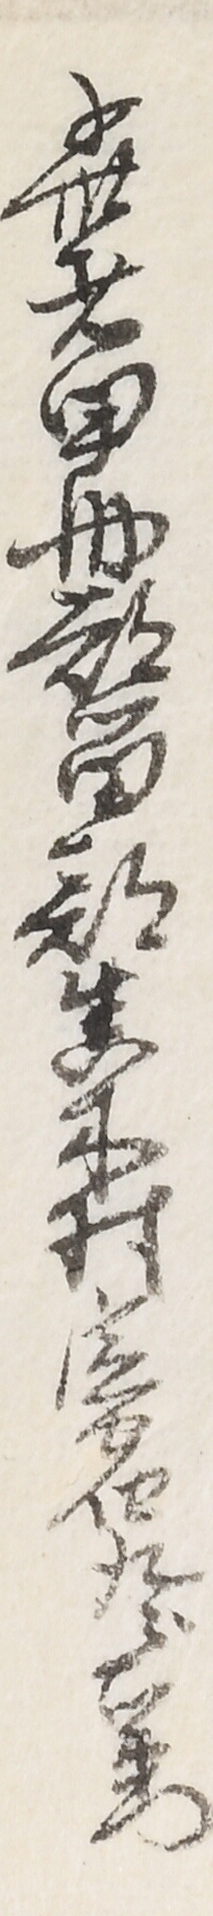此者甲州都留郡真木村定宿九郎右衛門
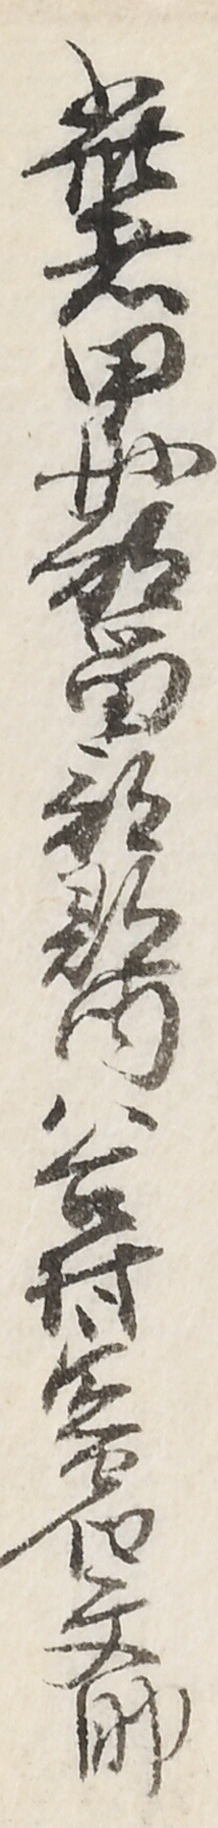此者甲州都留郡郡内谷村定宿文助
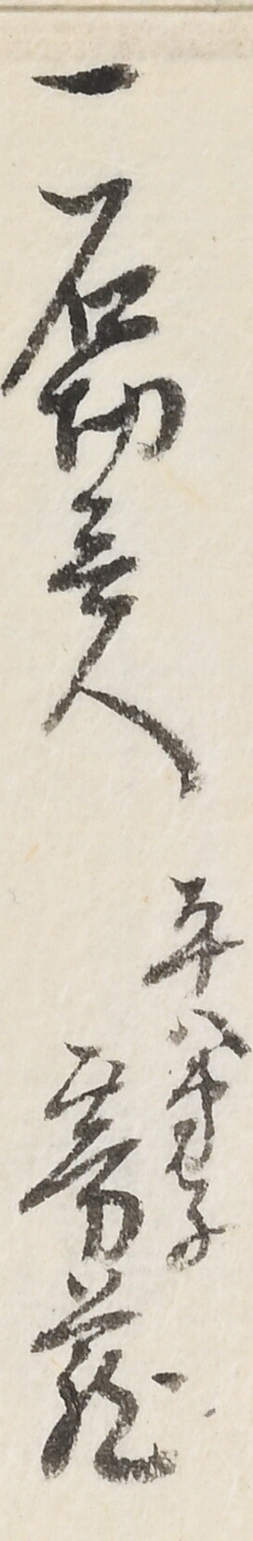一石切壱人鶴松
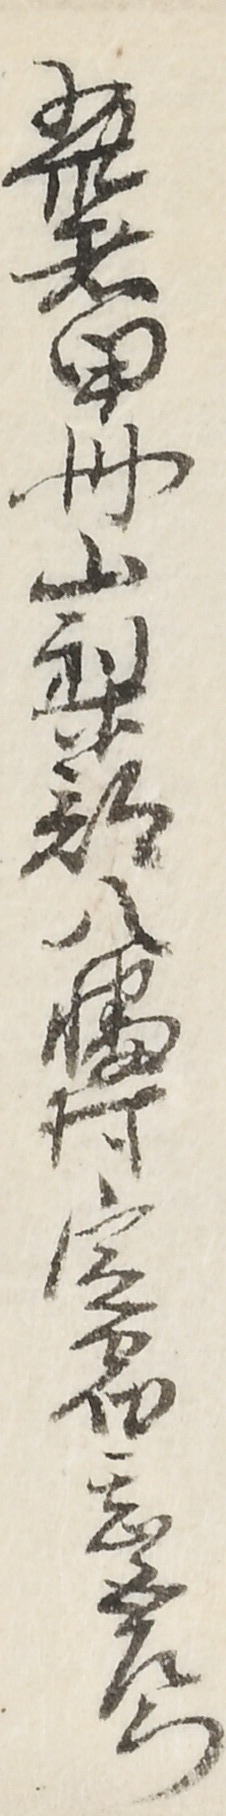此者甲州山梨郡八幡村定宿甚五右衛門
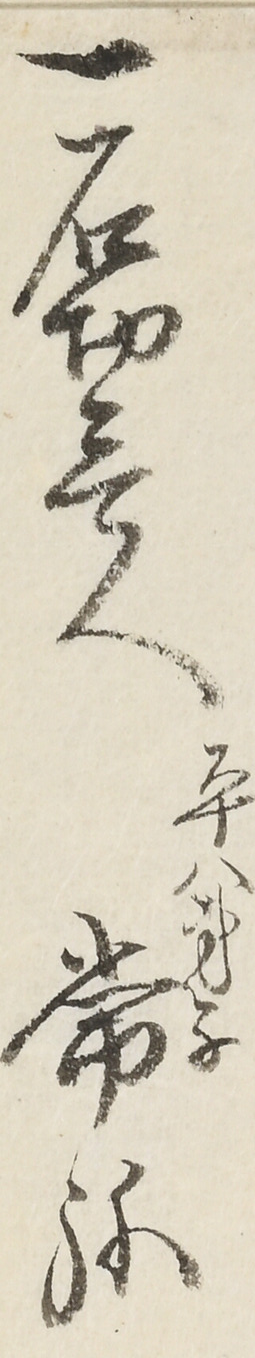一石切壱人鶴松
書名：嘉永六癸丑年二月他國出石切名前書上帳
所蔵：伊那市立高遠町図書館・合同会社AMANE
